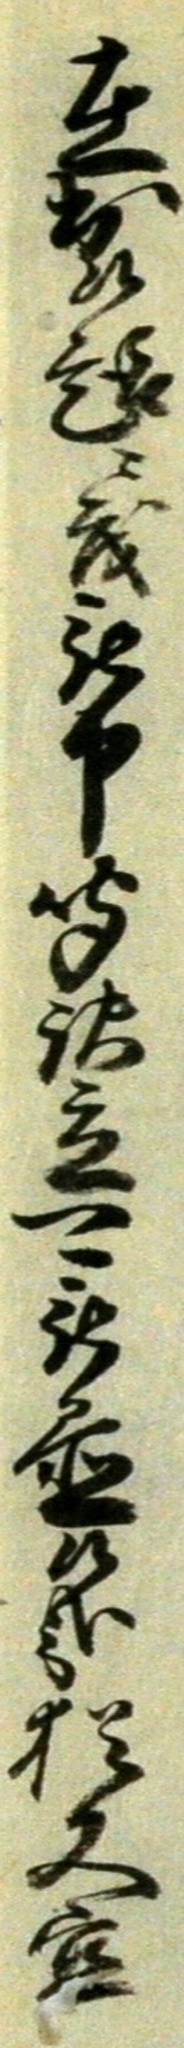在出候趣ニ茂被申聞訳立可被置候哉猶又
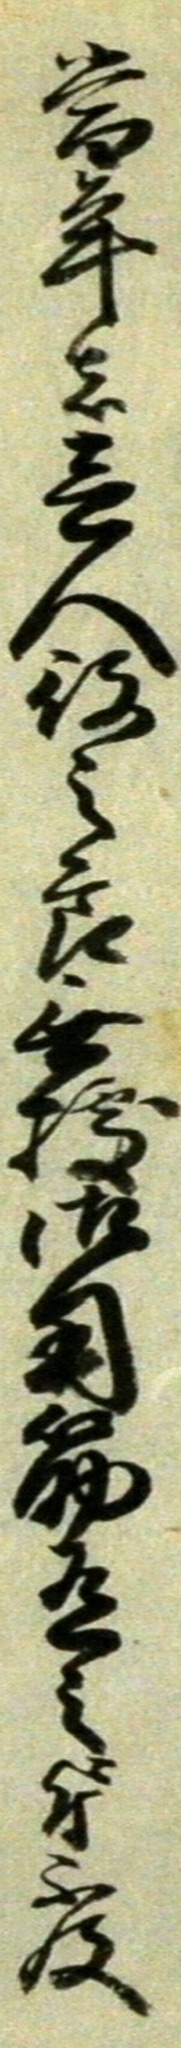当年者壱人役之節無拠御用筋有之ニ付不及
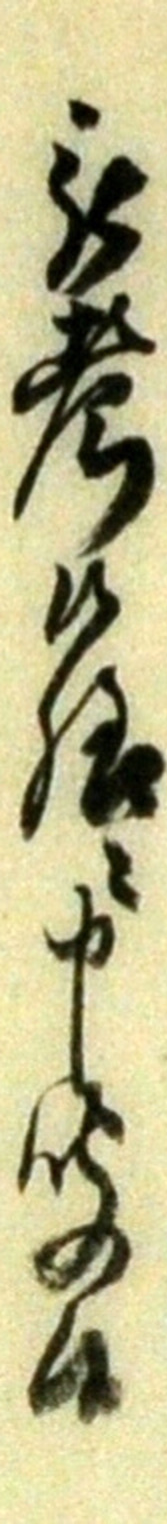被考候様ニ申聞候
